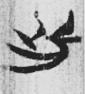此
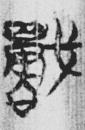○（戰）
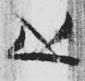之
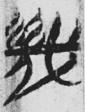幾（忌）
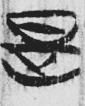是
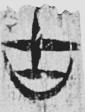古（故）
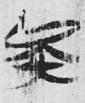矣（疑）
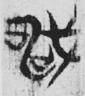○（陳）
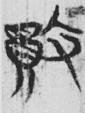敗
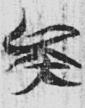矣（疑）
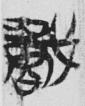○（戰）
